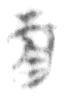百
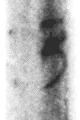乃
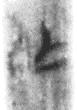亡
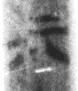亓（其）
